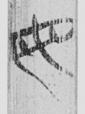母
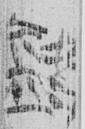欽
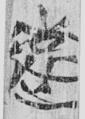遠
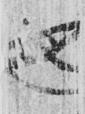母
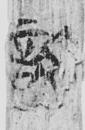詣
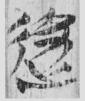逐
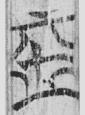亞（惡）
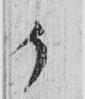人
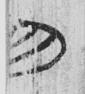勿
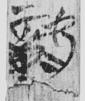○（陷）
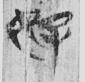好
